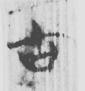古
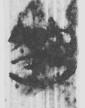昔
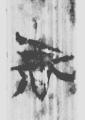者
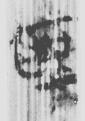聖
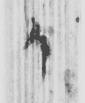人
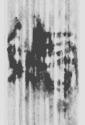紿
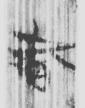者
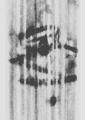是
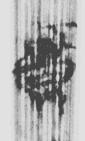貴
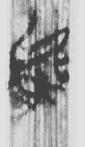能
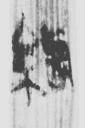紿
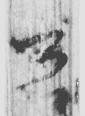乃
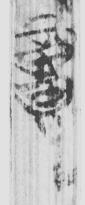{畐貝}
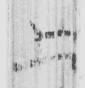上
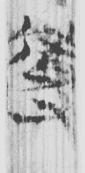{虍且又}
